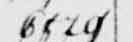6529
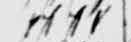1771
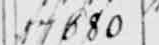17680
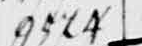9524
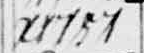21757
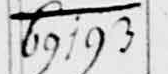69193
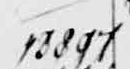13897
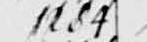1284
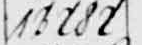13282
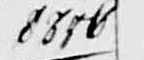8856
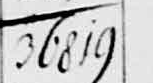36819
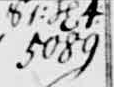5089
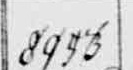8953
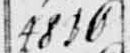4836
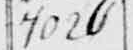7026
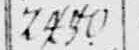2450
